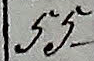55
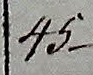45
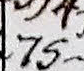75
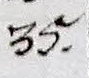35
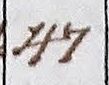47
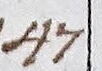47
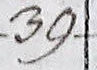39
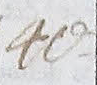40
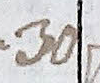30
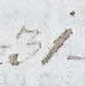31
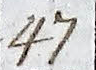47
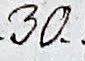30
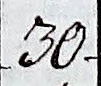30
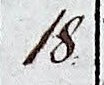18
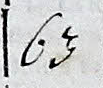63
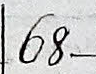68
